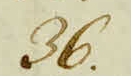36.
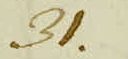31.
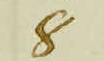8
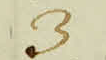3
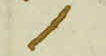1
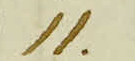11.
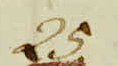25.
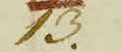13.
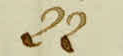22
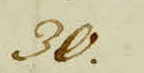30.
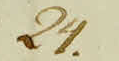24.
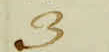3
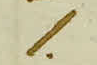1.
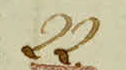22.
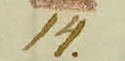14.
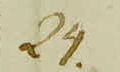24.
